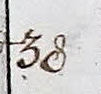38
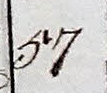57
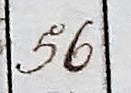56
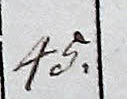45.
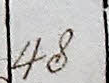48
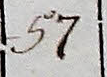57
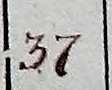37
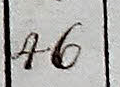46
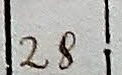28
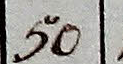50
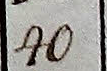40
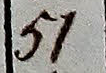51
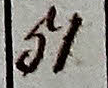51
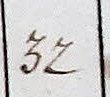32
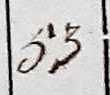53
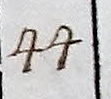44
